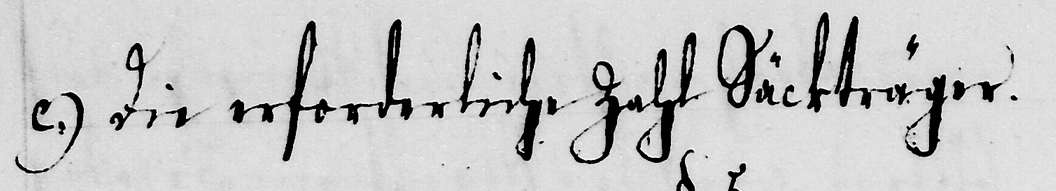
c.) Die erforderliche Zahl Säckträger.
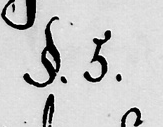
§.5.
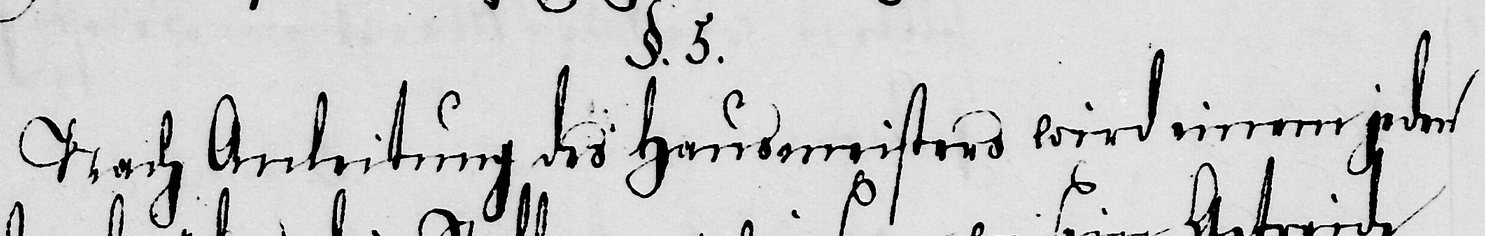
Nach Anleitung des Hausmeisters wird einem jeden
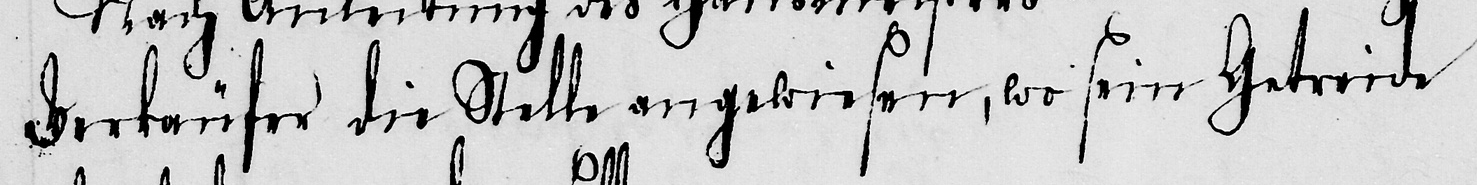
Verkäufer die Stelle angewiesen, wo sein Getreide
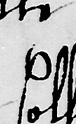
lt.
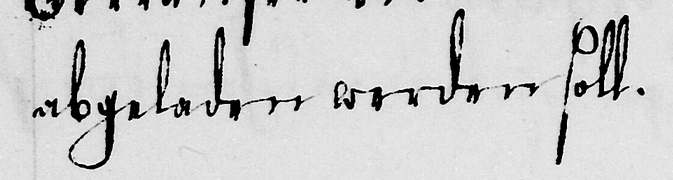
abgeladen werden soll.
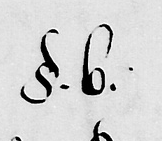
§.6.
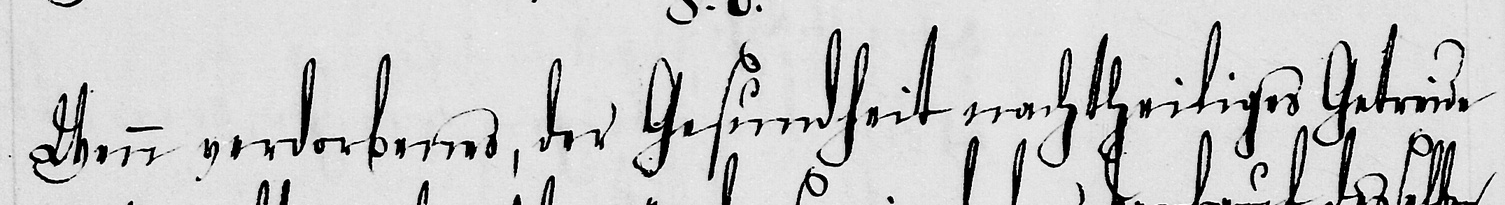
Wenn verdorbenes, der Gesundheit nachtheiliges Getreide
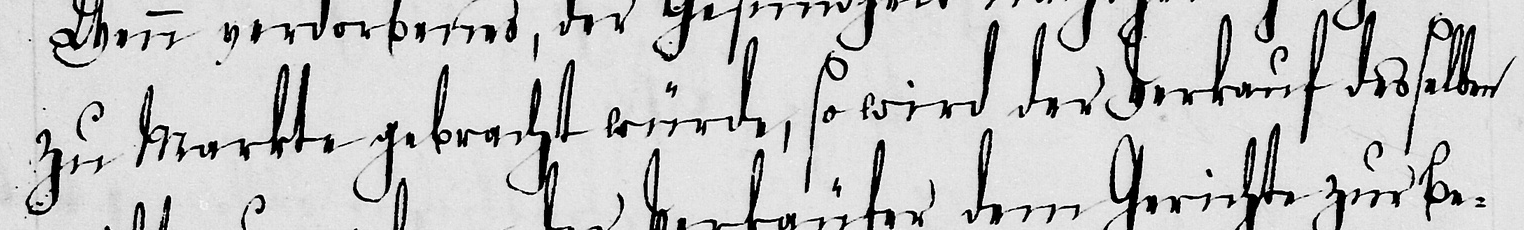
zu Markte gebracht würde, so wird der Verkauf desselb¬
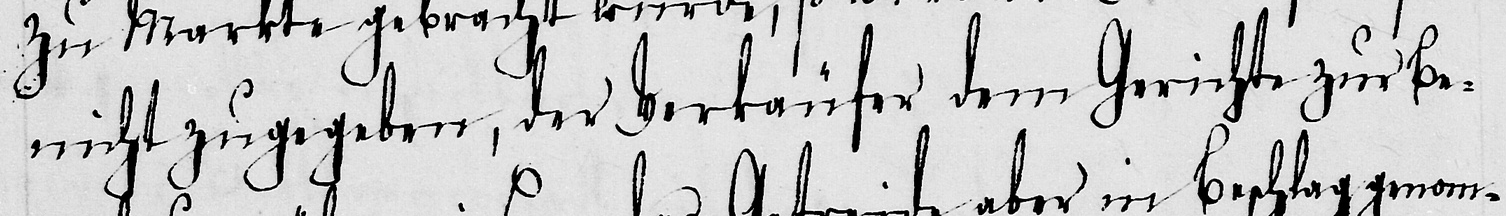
nicht zugegeben, der Verkäufer dem Gerichte zur Be¬
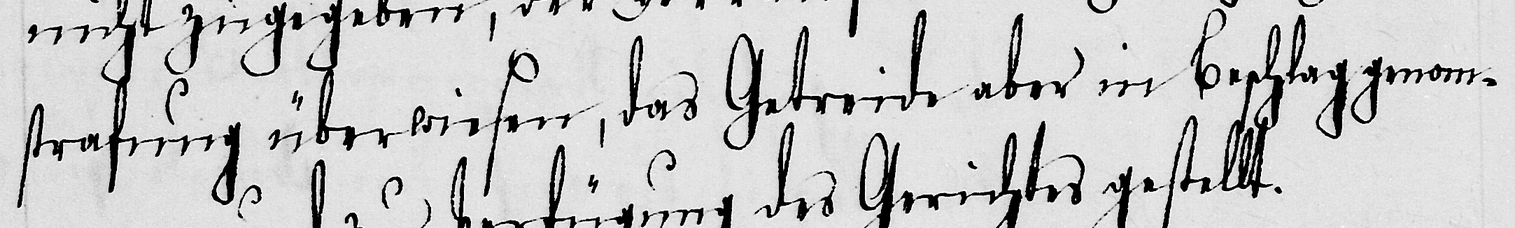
strafung überwiesen, das Getreide aber in Beschlag genom¬
